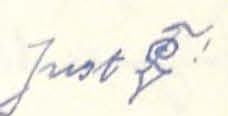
Just CI!
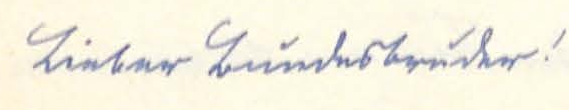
Lieber Bundesbruder!
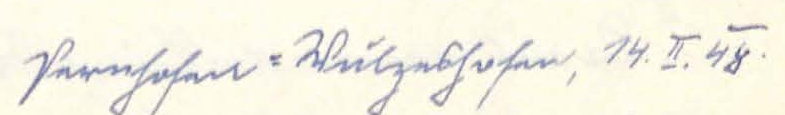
Pernhofen-Wulzeshofen, am 14.2.1948
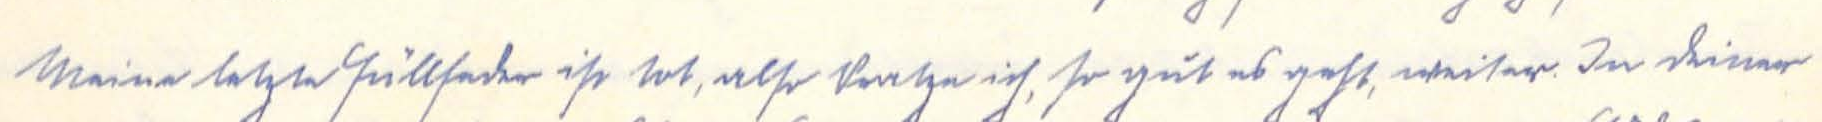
Meine letzte Füllfeder ist tot, also kratze ich, so gut es geht, weiter. In deiner
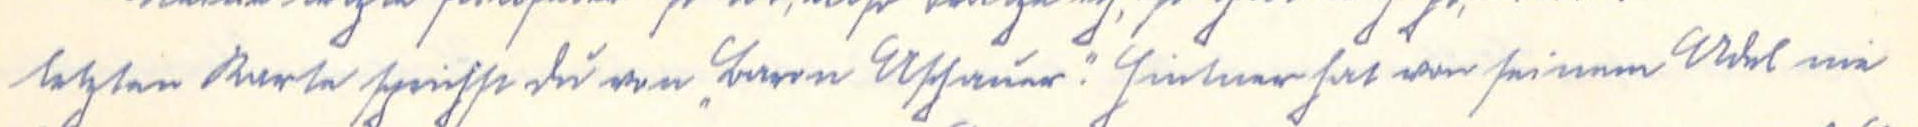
letzten Karte sprichst du von "Baron Aschauer". Hintner hat von seinem Adel nie
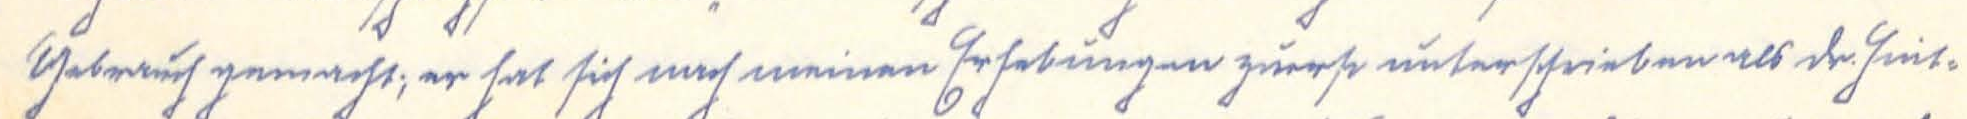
Gebrauch gemacht; er hat sich nach meinen Erfahrungen zuerst unterschrieben als Dr. Hint-
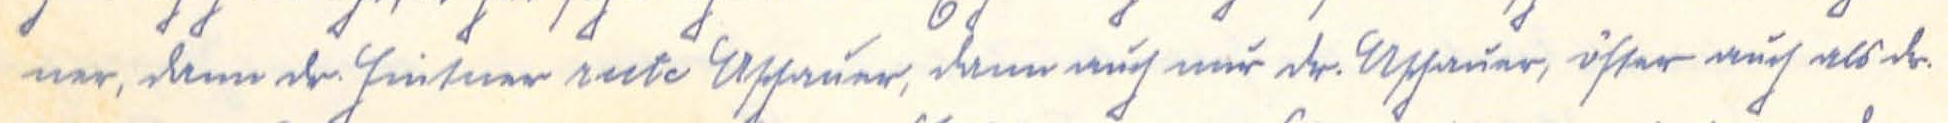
ner, dann Dr. Hintner recte Aschauer, dann auch nur Dr. Aschauer, öfter auch als Dr.
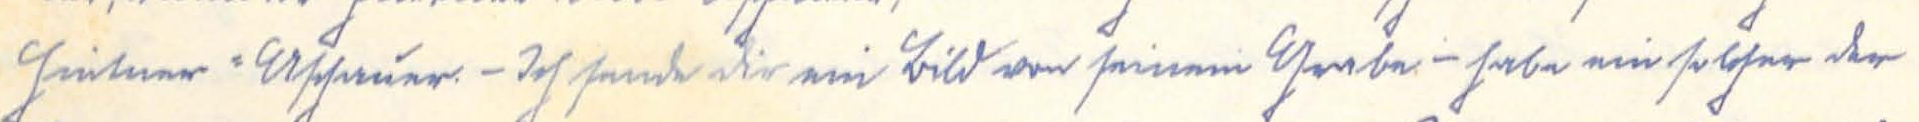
Hintner-Aschauer. - Ich sende dir ein Bild von seinem Grabe - habe ein solchen der
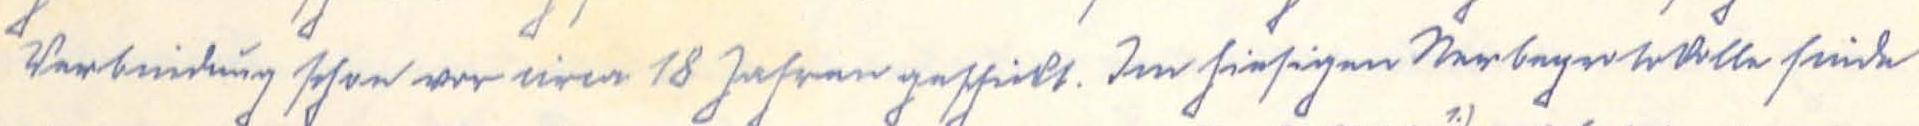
Verbindung schon vor circa 18 Jahren geschickt. Im hiesigen Sterbeprotokole finde
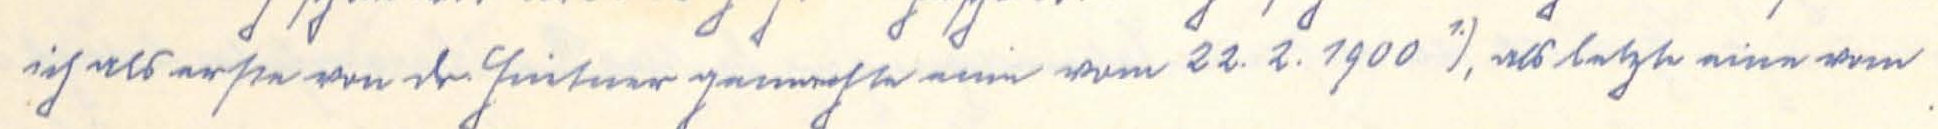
ich als erste von Dr. Hintner gemachte eine vom 22.2.1900 1.), als letzte eine vom
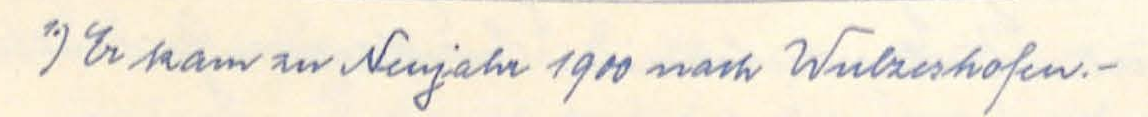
1.) Er kam zu Neujahr 1900 nach Wulzeshofen.-
